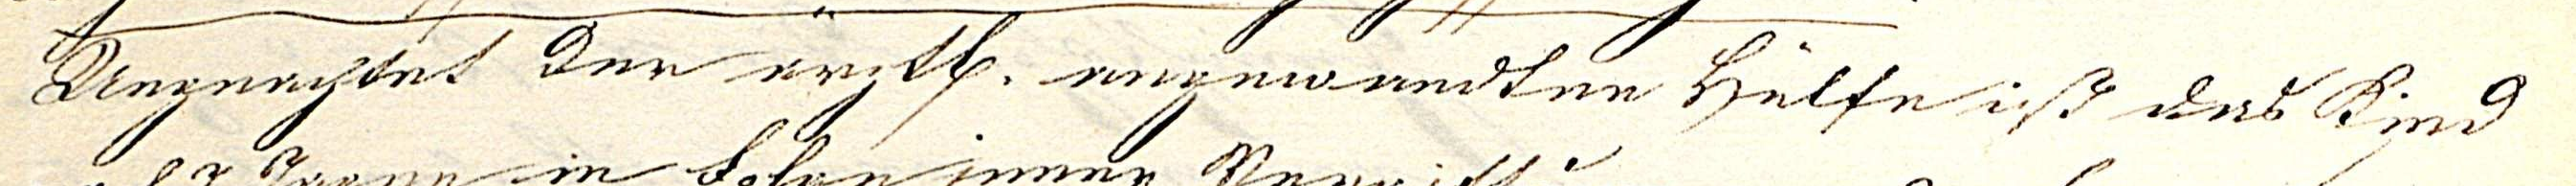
Ungeachtet der ärztl. angewandten Hülfe ist das Kind
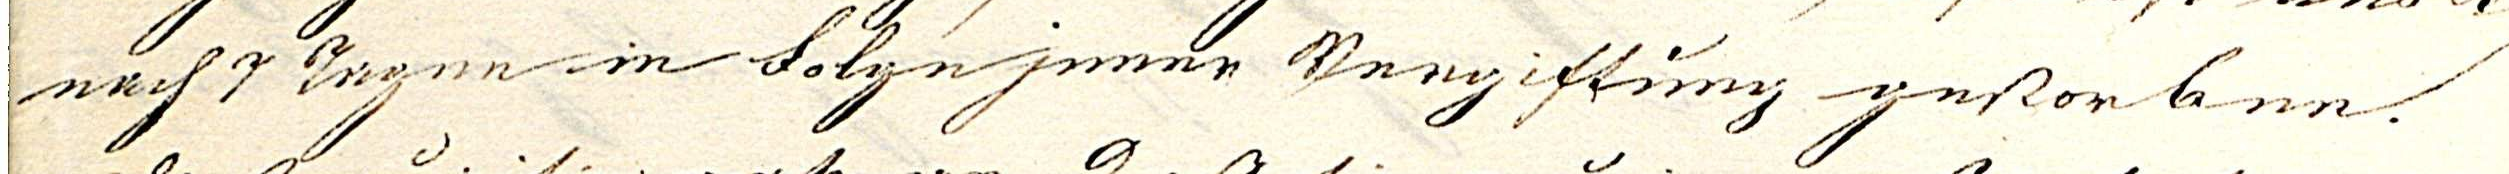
nach 7 Tagen in Folge jener Vergiftung gestorben.
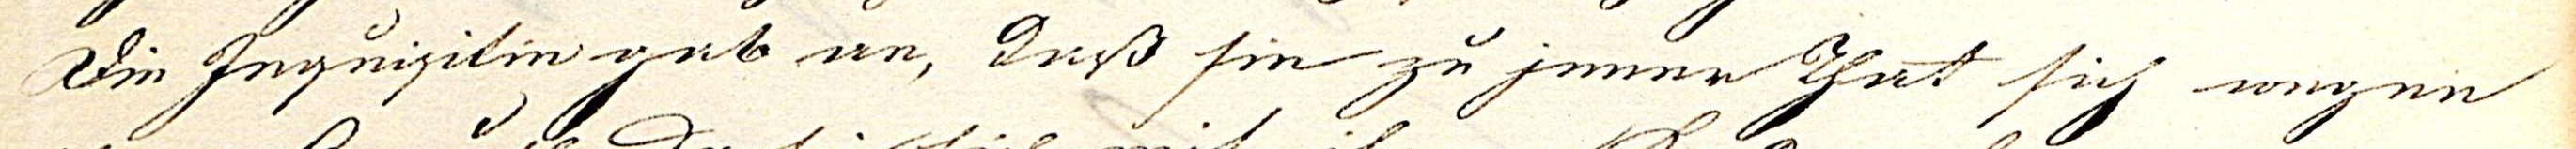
Die Jnquisitin gab an, daß sie zu jener That sich wegen
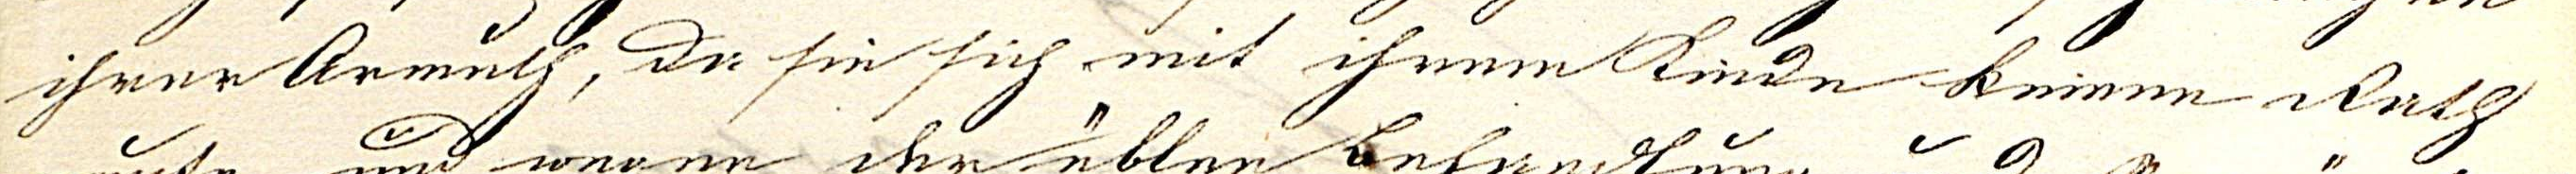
ihrer Armuth, da sie sich mit ihrem Kinde keinen Rath
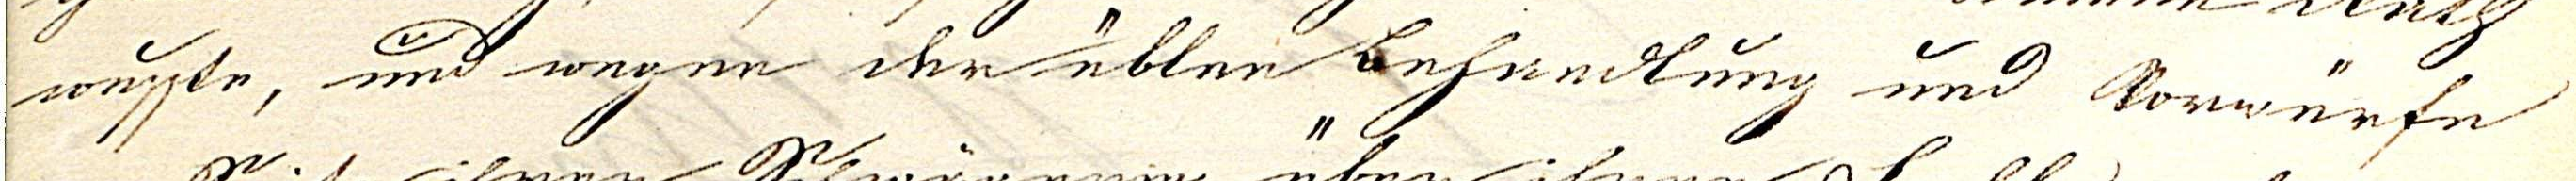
wusste, und wegen xx übten Behandlung und Vorwürfe
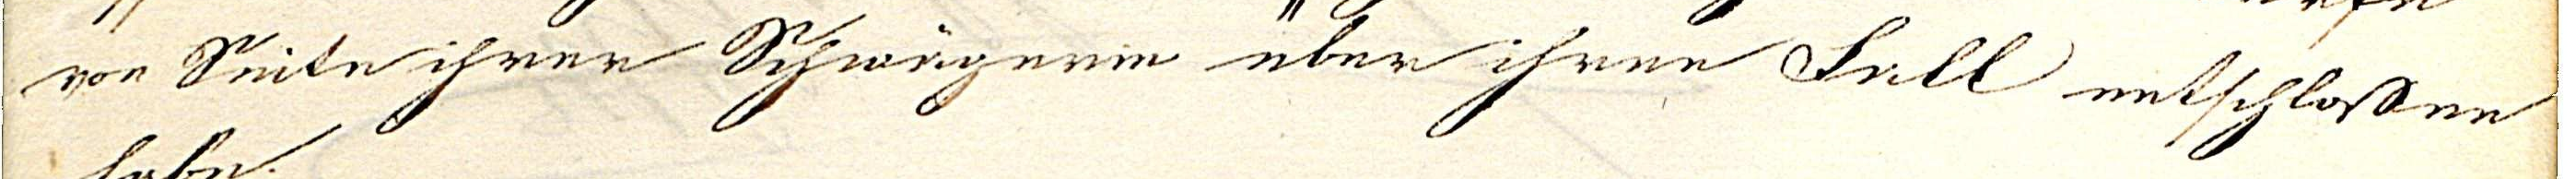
von Seite ihrer Schwägerin über ihren Fall entschloßen
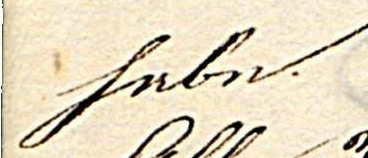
habe.
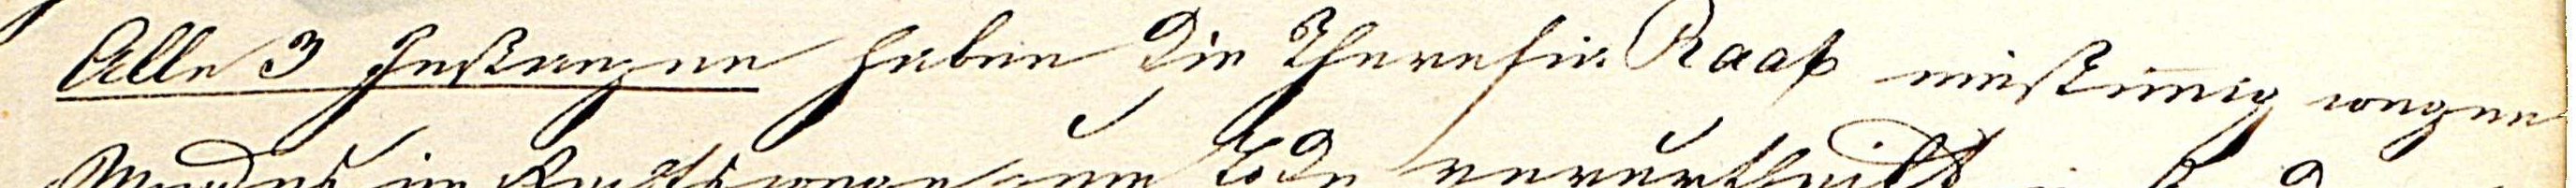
Alle 3 Jnstanzen haben die Theresia Raab einstimmig wegen
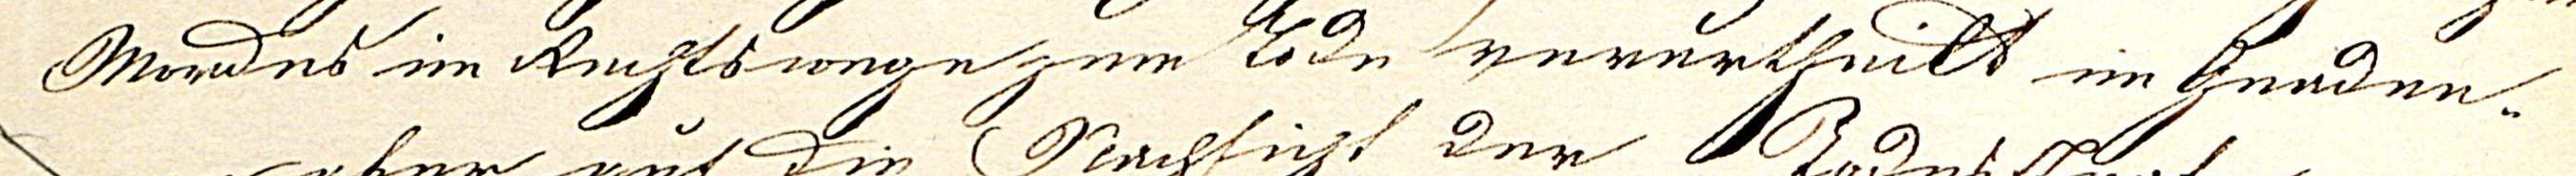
Mordes im Rechtswege zum Tode verurtheilt im Gnaden¬
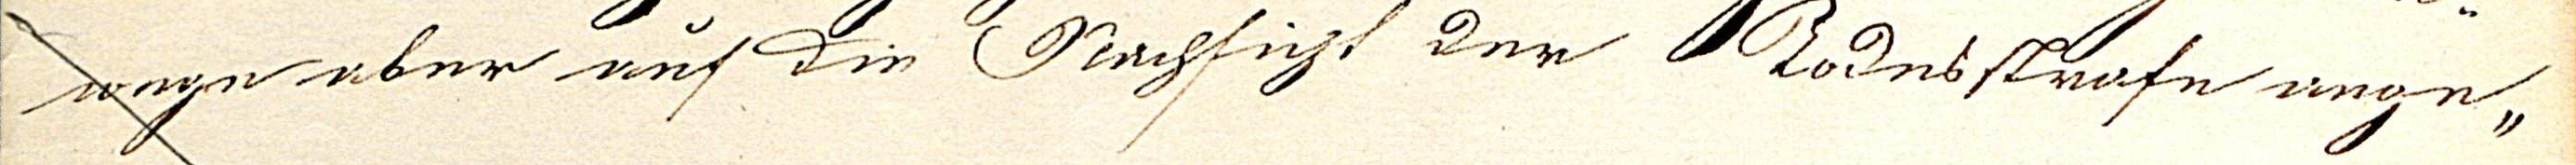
wege aber auf die Nachsicht der Todesstrafe ange¬
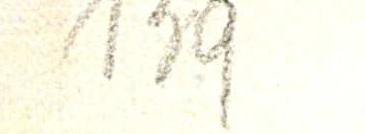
139
